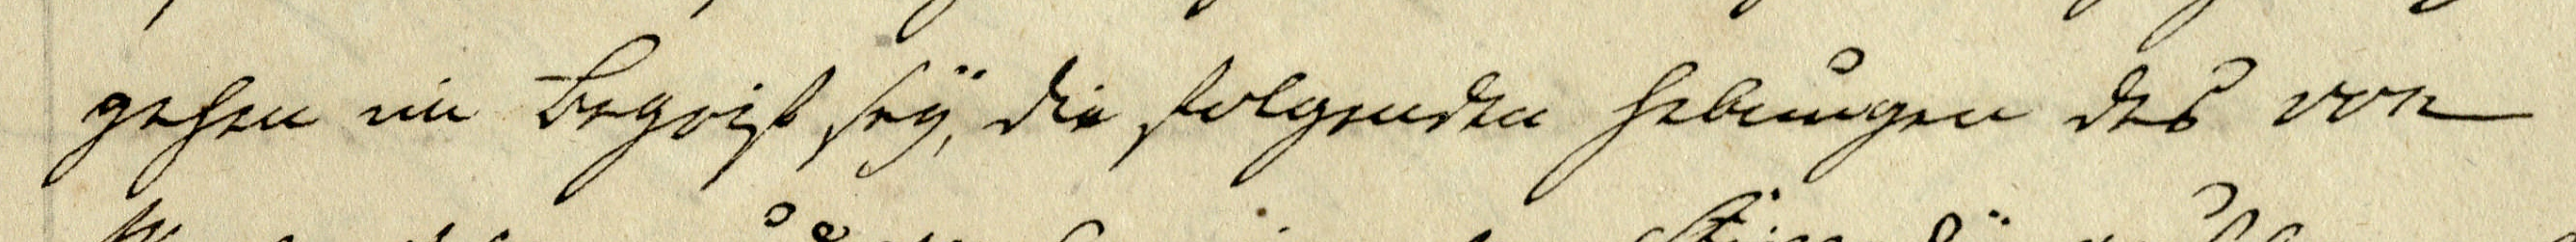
gehen im Begrif seÿ, die folgenden Hebungen des von
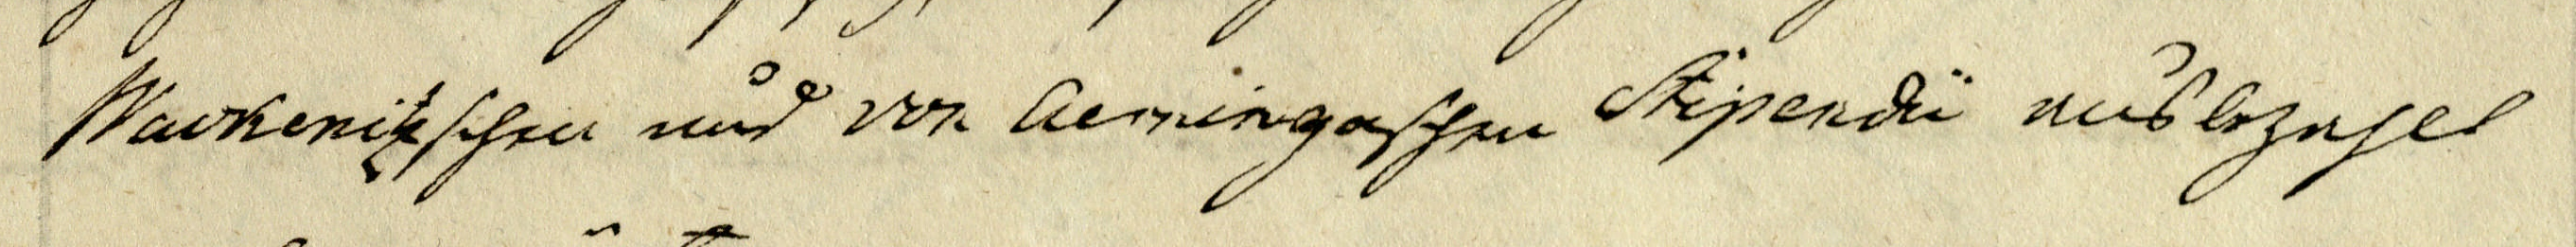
Wackenitzschen und von Aemingaschen Stipendii ausbezahlt
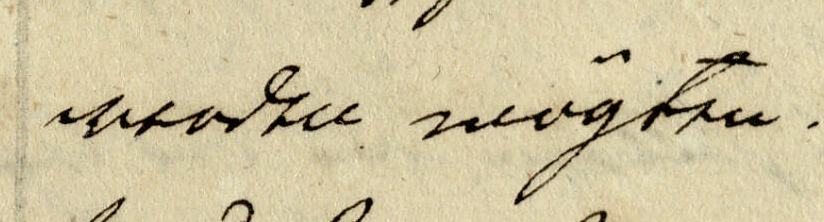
werden mögten.
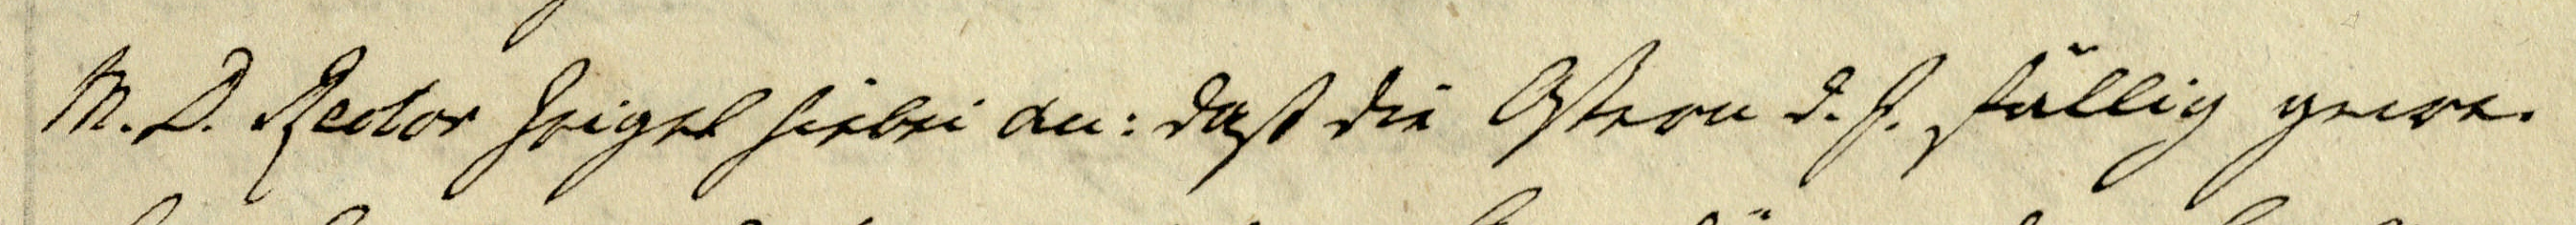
M. D. Rector zeiget hiebei an: daß die Ostern d. J. fällig gewe¬
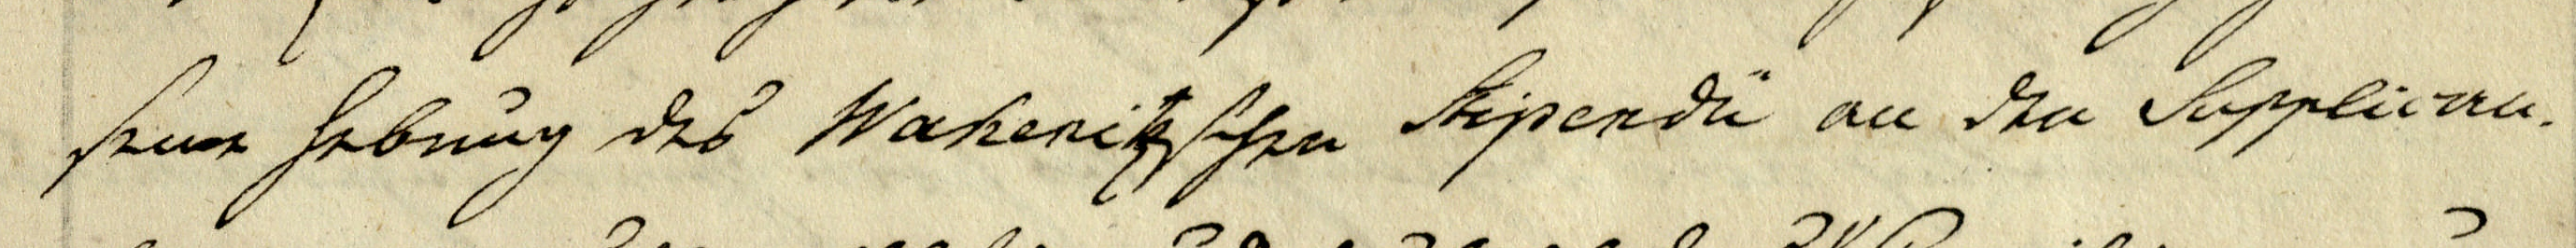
sene Hebung des Wakenitzschen Stipendii an den Supplican¬
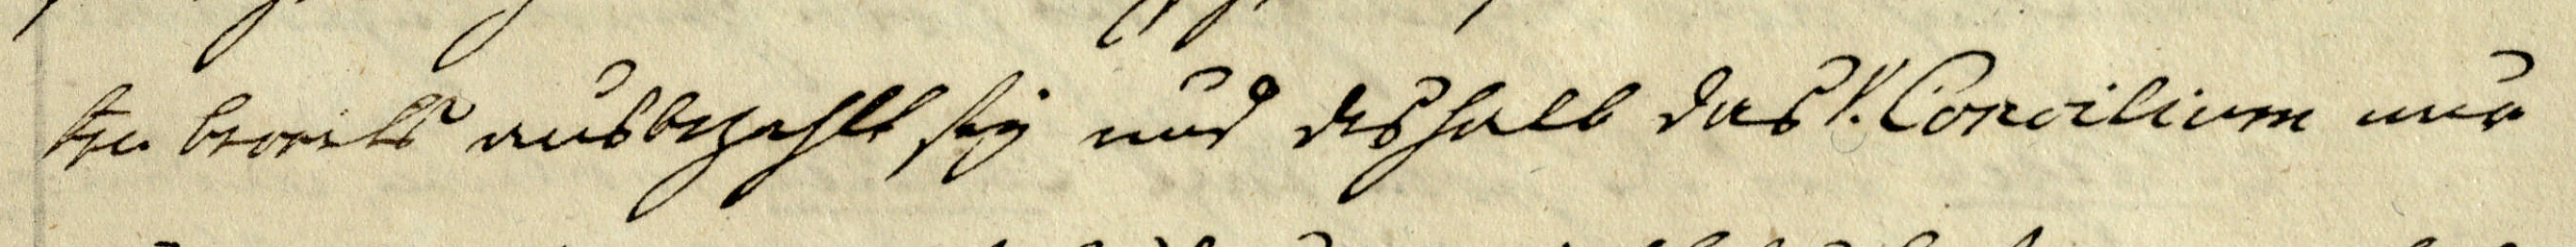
ten bereits ausbezahlt seÿ und deshalb das V. Concilium nur
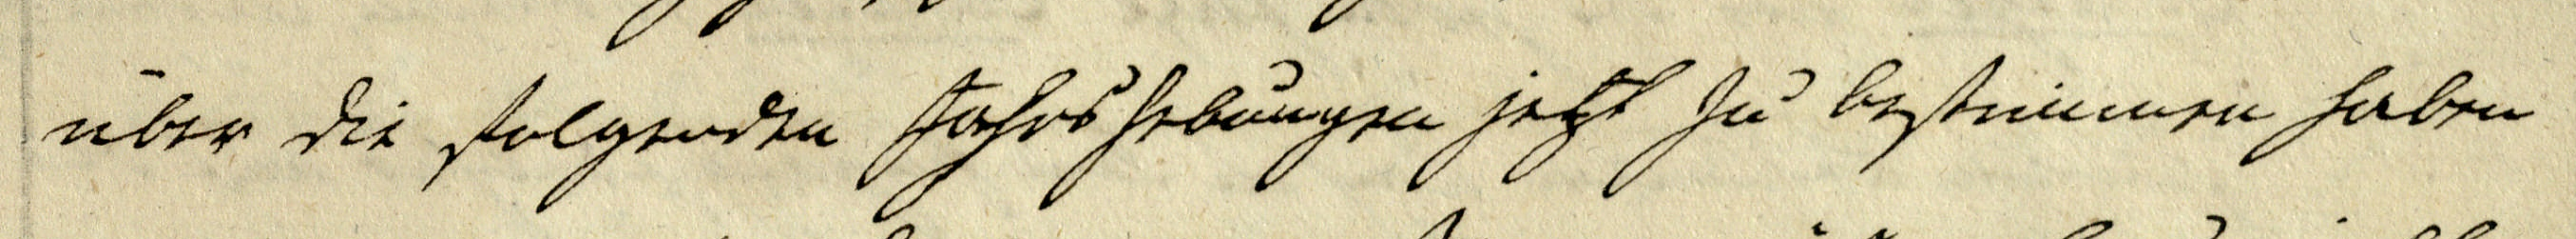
über die folgenden Jahrshebungen jetzt zu bestimmen haben
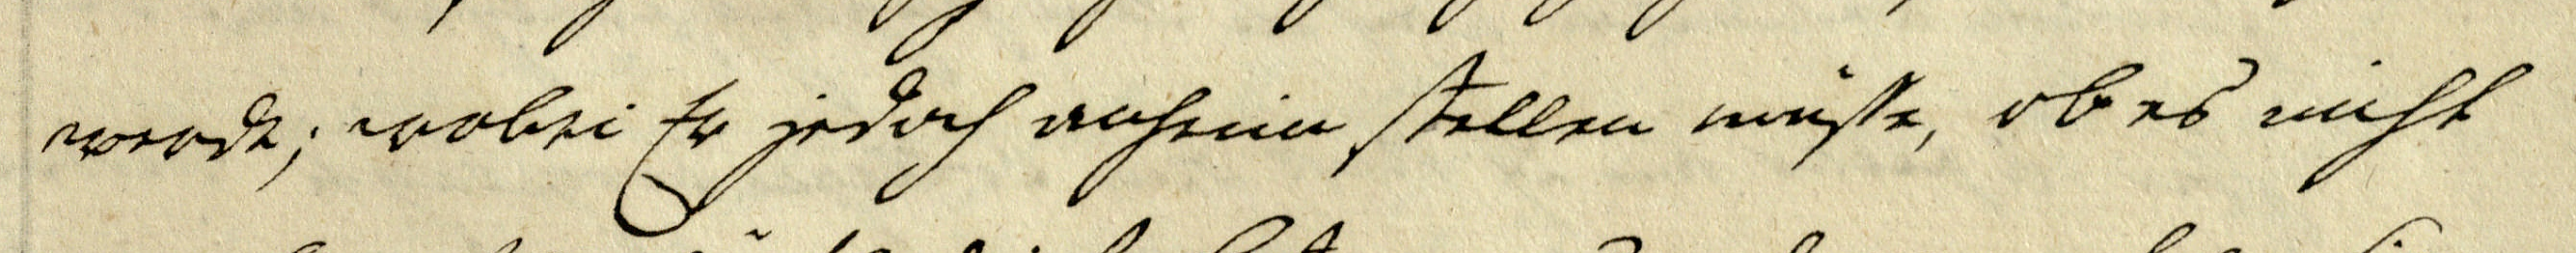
werde, wobei Er jedoch anheim stellen müsse, ob es nicht
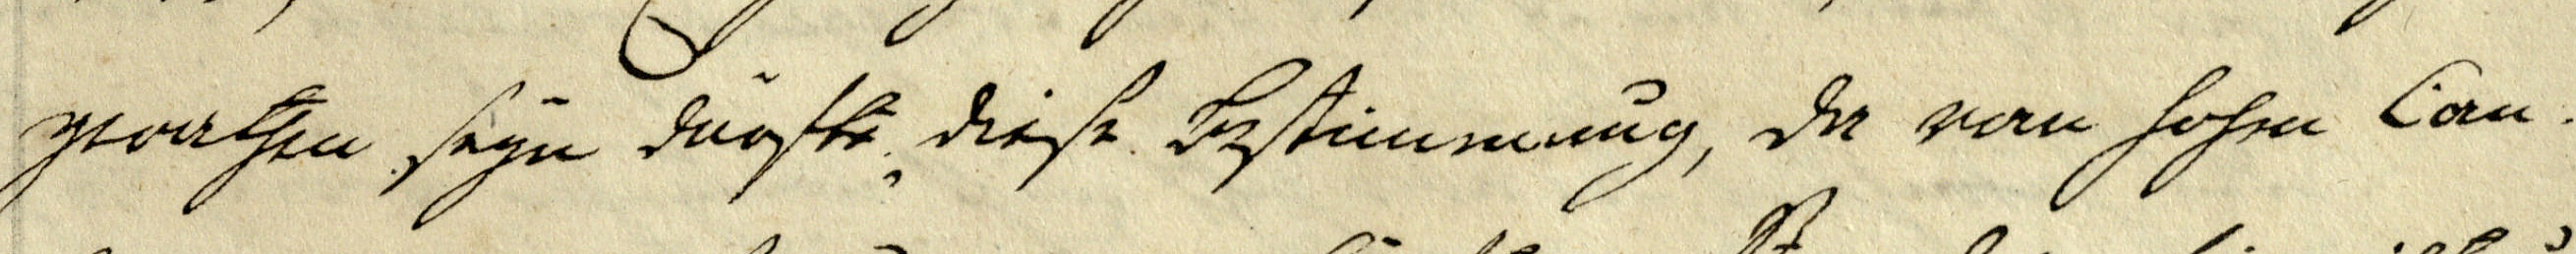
gerathen seÿn dürfte, diese Bestimmung, da vom hohen Can¬
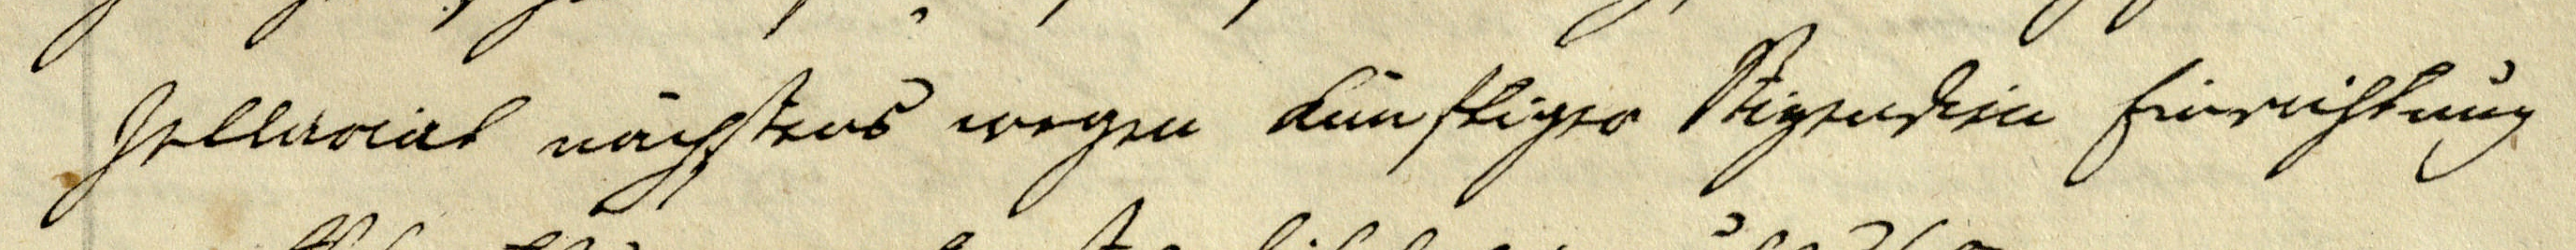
zellariat nächstens wegen künftiger Stipendien Einrichtung
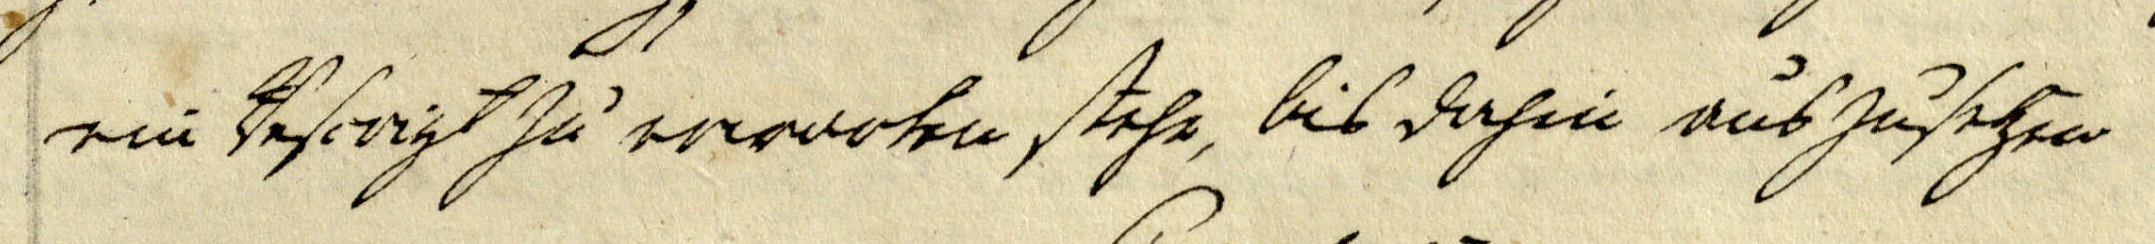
ein Rescript zu erwarten stehe, bis dahin auszusetzen.
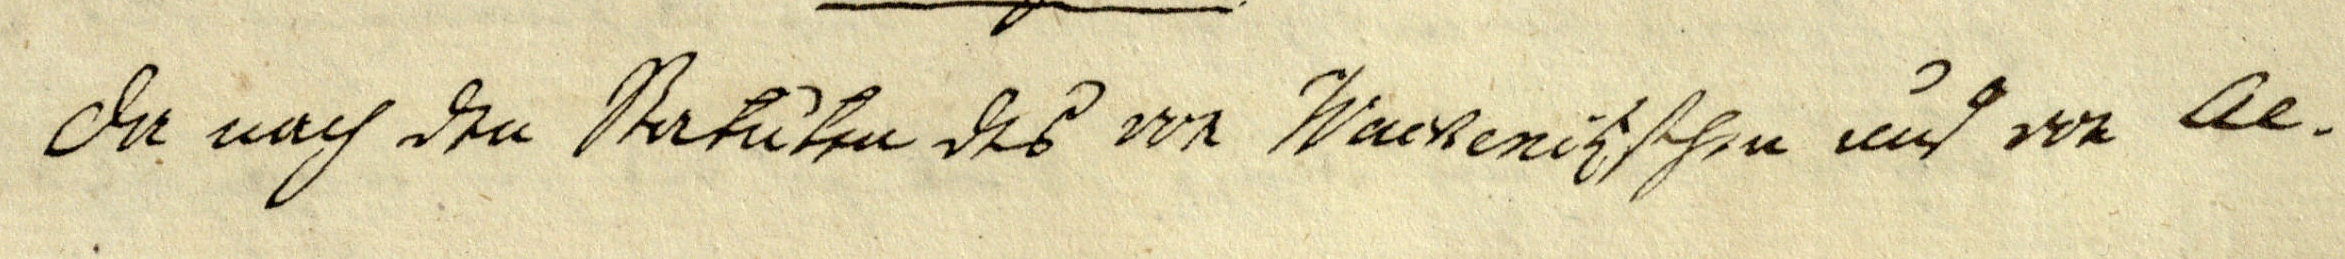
Da nach den Statuten des von Wackenitzschen und von Ae¬
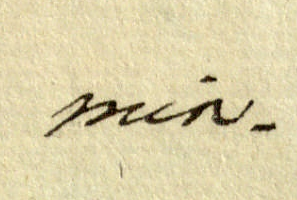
min¬
